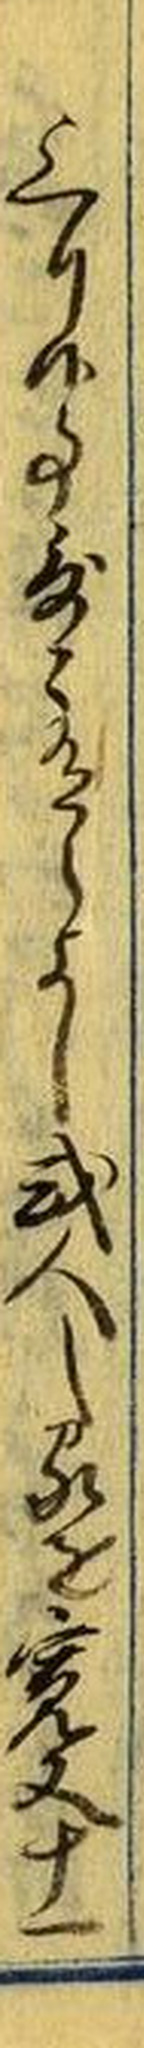上り候事度々有之よし或人之家を寛文十一
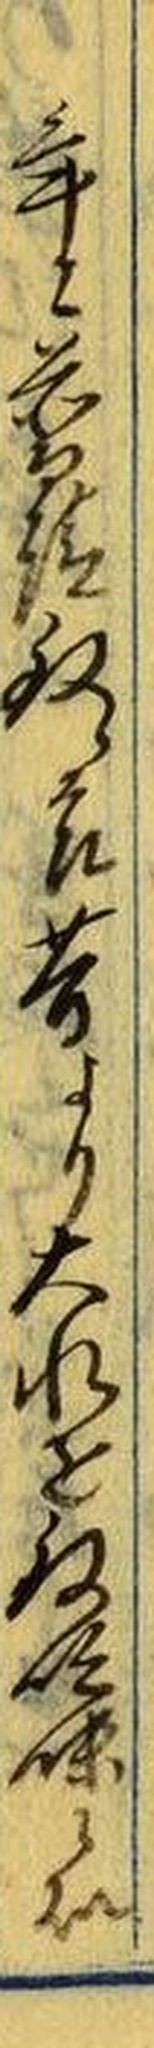年ニ普請致候節昔より大水を致吟味候処
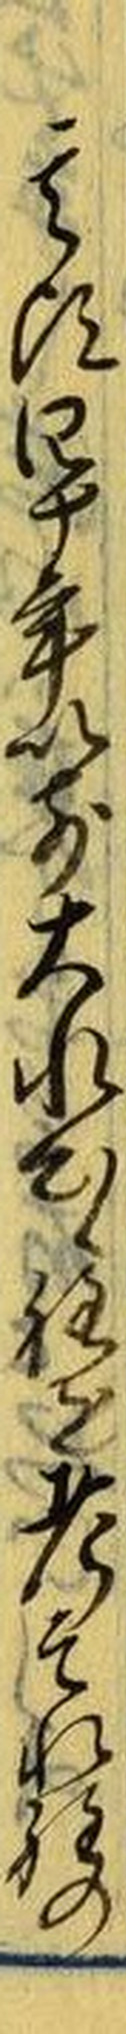其頃四十年以前大水出候程を考それ程の
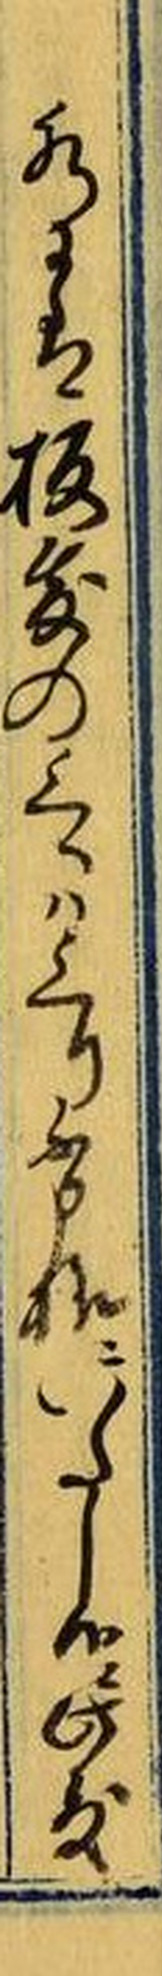水には板敷の上へハ上り不申様ニいたし候ニ此度
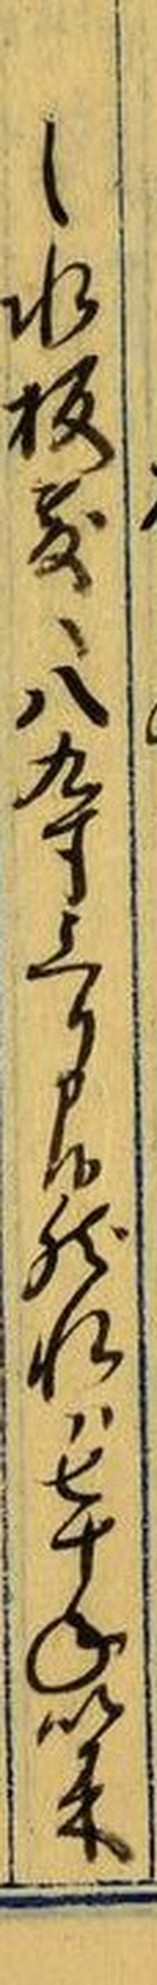之水板敷へ八九寸上り申候然れハ七十年以来
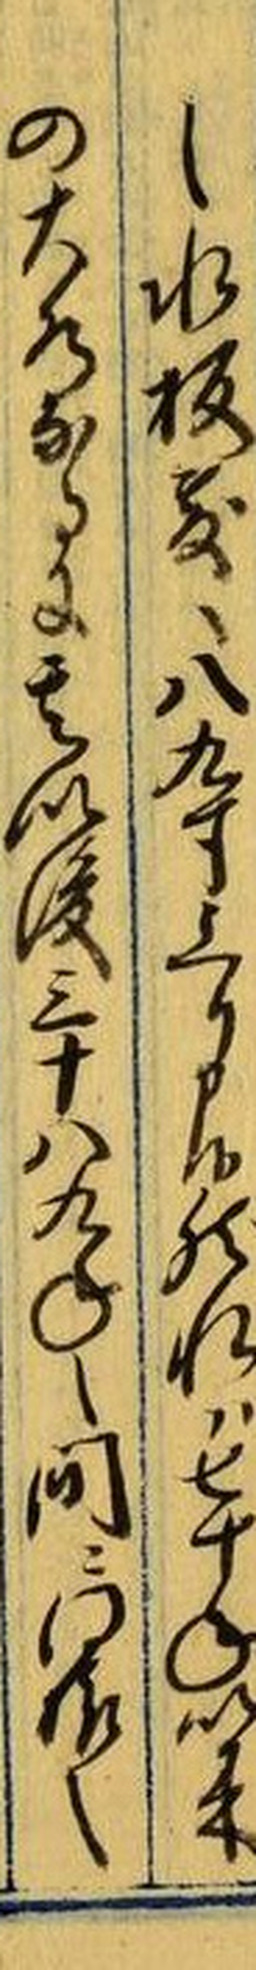の大水なるに其以後三十八九年之間ニ同様之
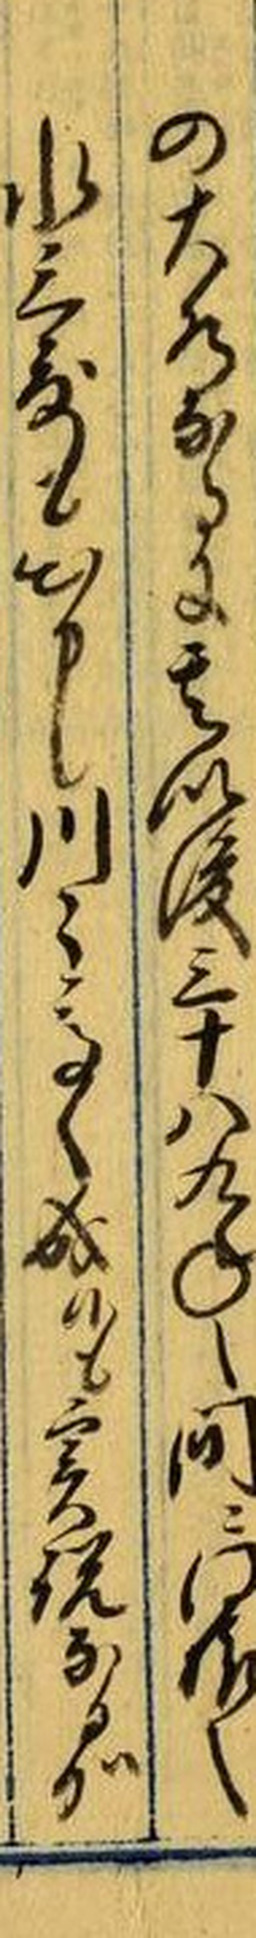水三度も出申候川々高く成候も実説なるが

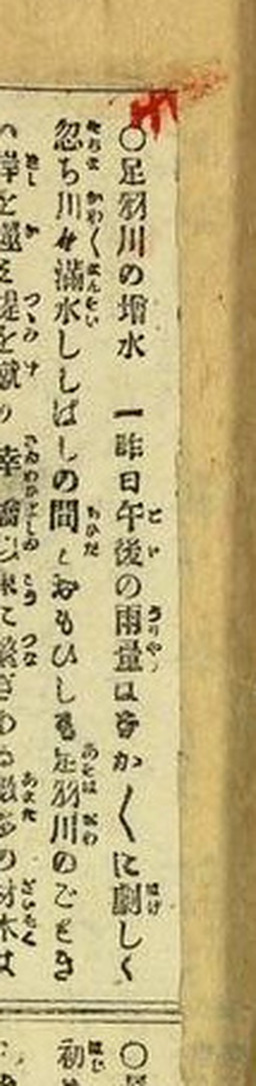○足羽川之増水一昨日午後の雨量はなか〳〵に劇しく
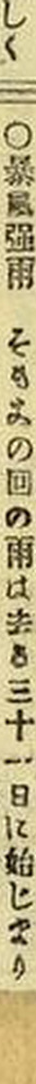○暴風強雨そもこの回の雨は去る三十一日に始じまり
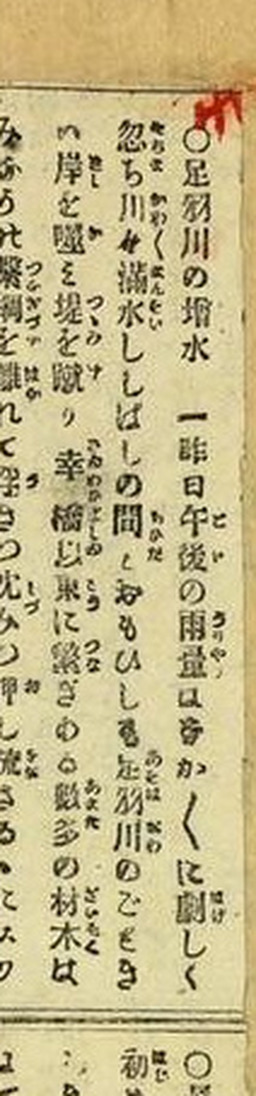忽ち川々満水ししばしの間とおもひしも足羽川のごとき
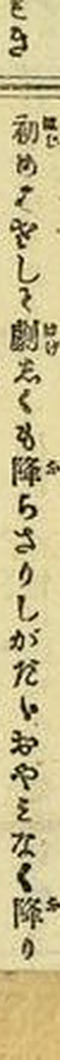初めはさして劇しくも降らさりしがたゞおやみなく降り
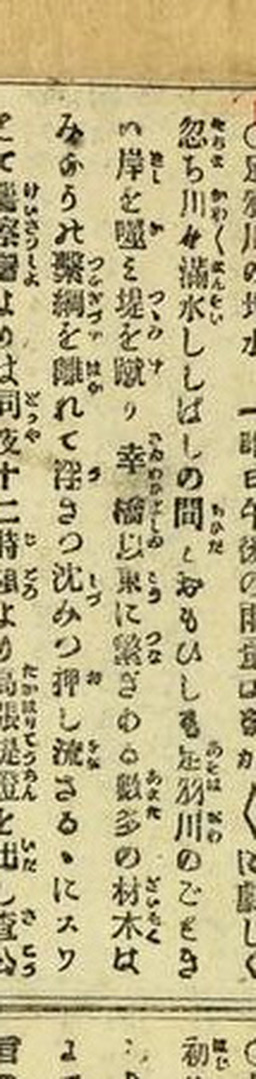は岸を噬み堤を蹴り幸橋以東に繋ぎある数多の材木は
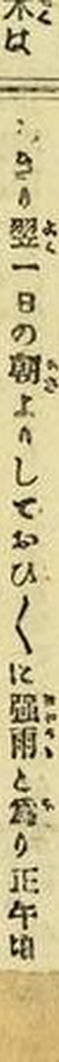しきり翌一日の朝よりしておひ〳〵に強雨と為り正午頃
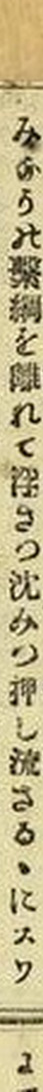みなかの繋綱を離れて浮きつ沈みつ押し流さるゝにスワ
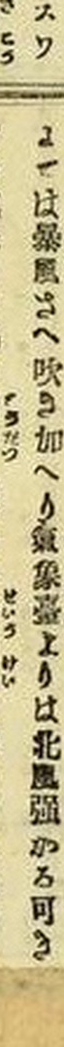にては暴風さへ吹き加へり気象台よりは北風強かる可き
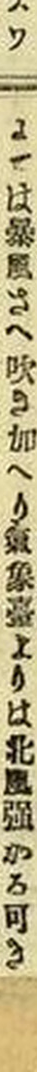にては暴風さへ吹き加へり気象台よりは北風強かる可き
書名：温古集 五巻
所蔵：福井県文書館 Fukui Prefectural Archives
